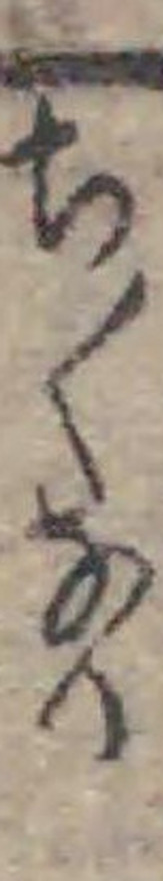ち〳〵なり
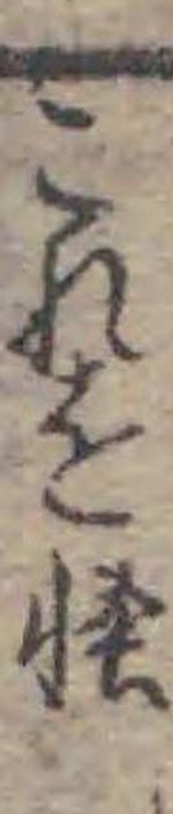これを怪
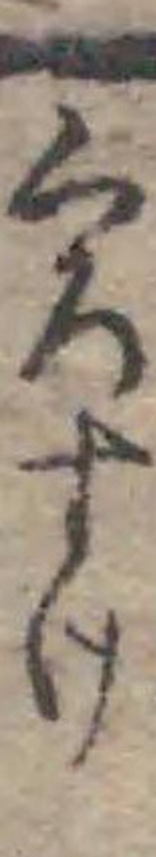くろすけ
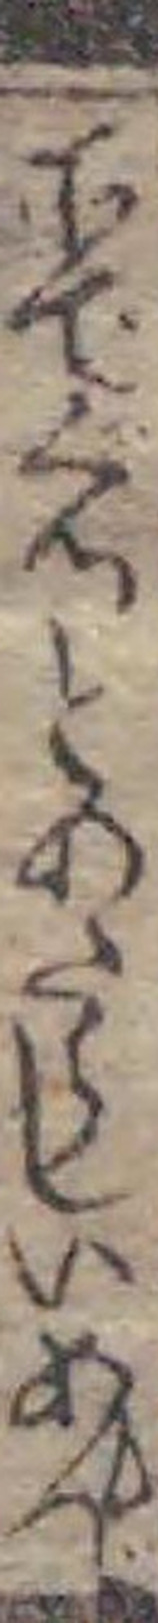所でくつとあたらしいあんじ
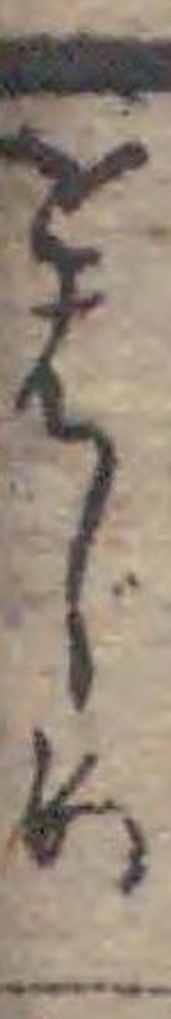をはじめ
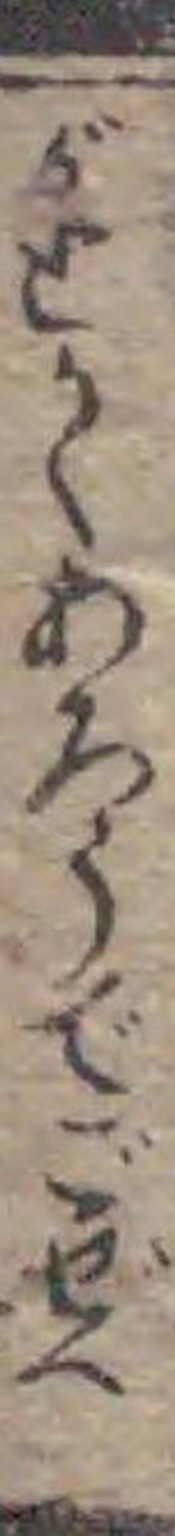がとかくあろうでごぜへ
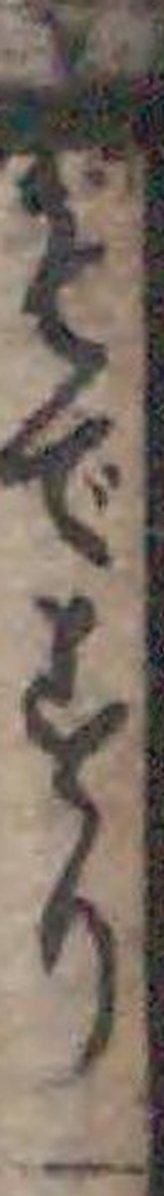そですり
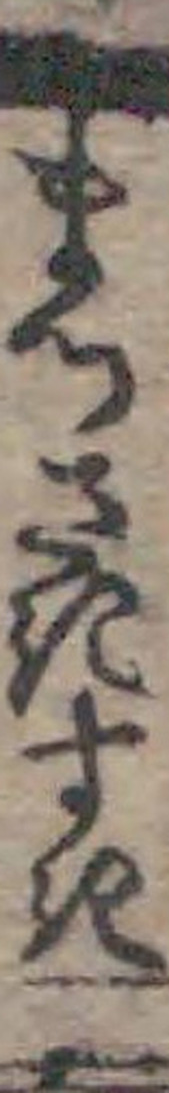まつさきすき
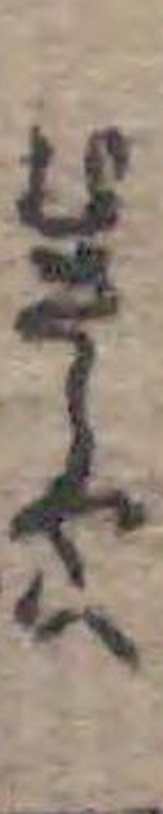むさしやへ
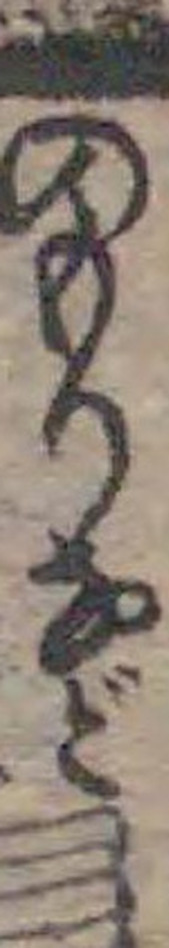のもりなど
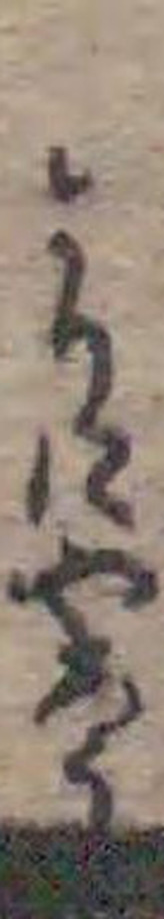とりにやろう
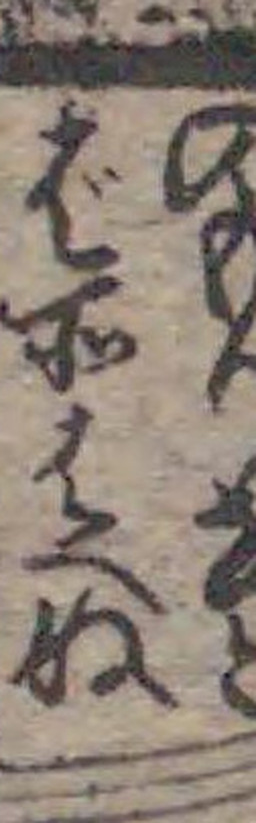ば所はへぬ
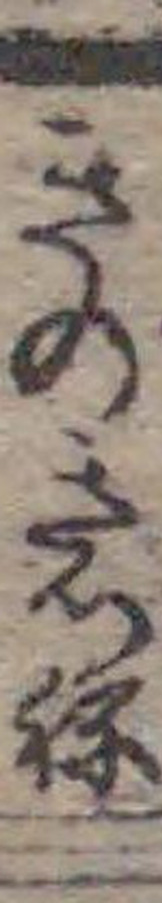きのきつね
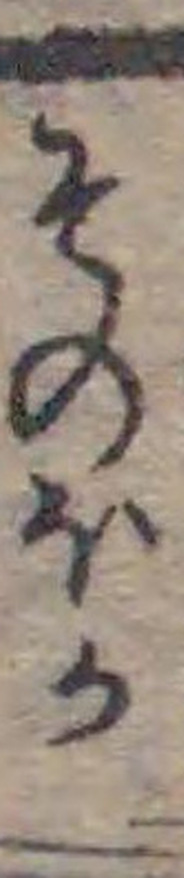そのほか
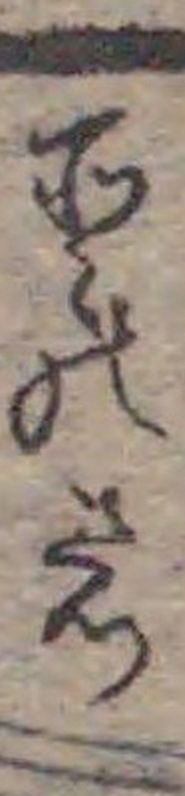所々のきつ
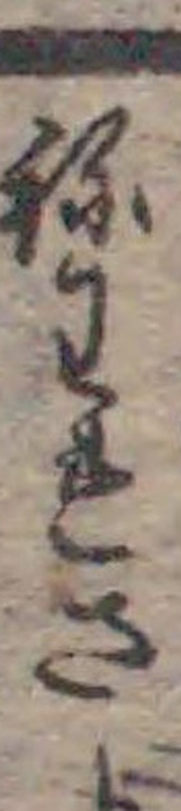ねわれさ
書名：紺屋百物語 : 3巻
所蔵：国立国会図書館 National Diet Library, JAPAN
